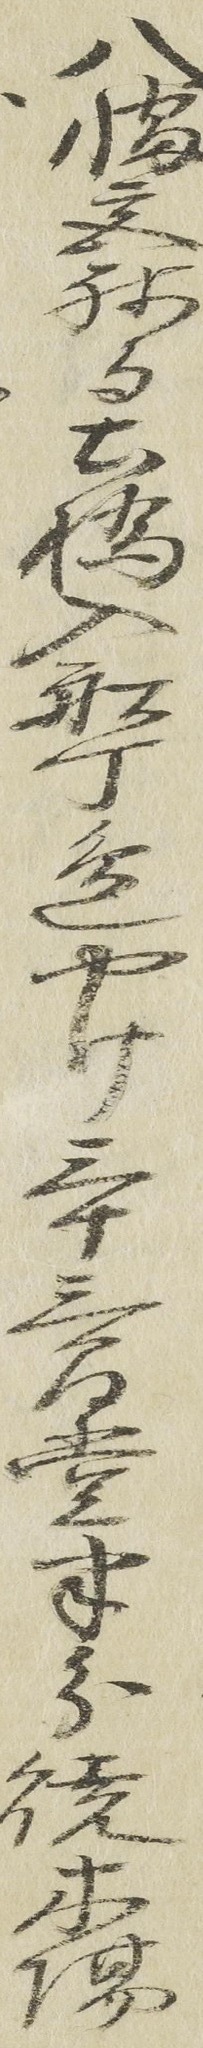八幡宮残る土橋入船丁辺やけ三十三間堂半分焼木場
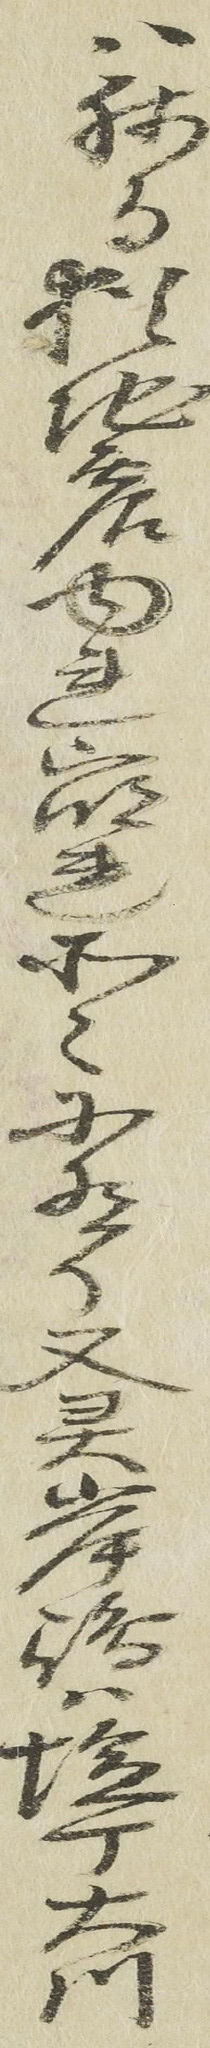ハ残る猶地震ゆれ崩れ所〻に有り又霊岸嶋ハ塩丁大川
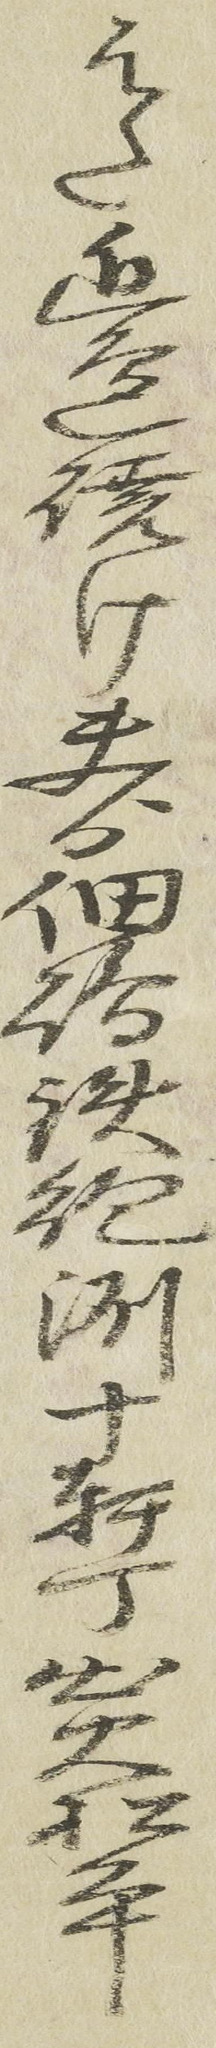はた近辺焼け夫ゟ佃嶋鉄砲洲十軒丁出火松平
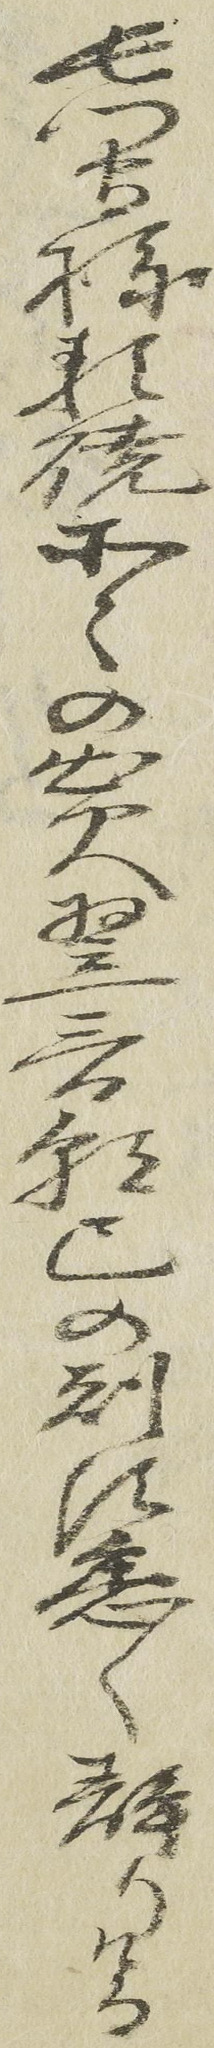長門守様類焼所〻の出火翌三日朝巳の刻頃悉く静りケる
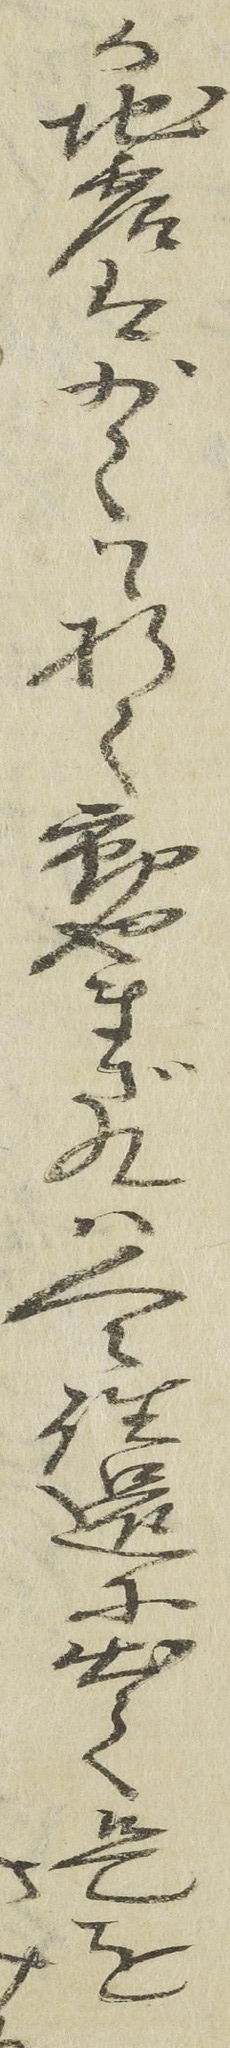か地震は少しツヽ折〻動やまざれハ人〻往還に出て是をさける

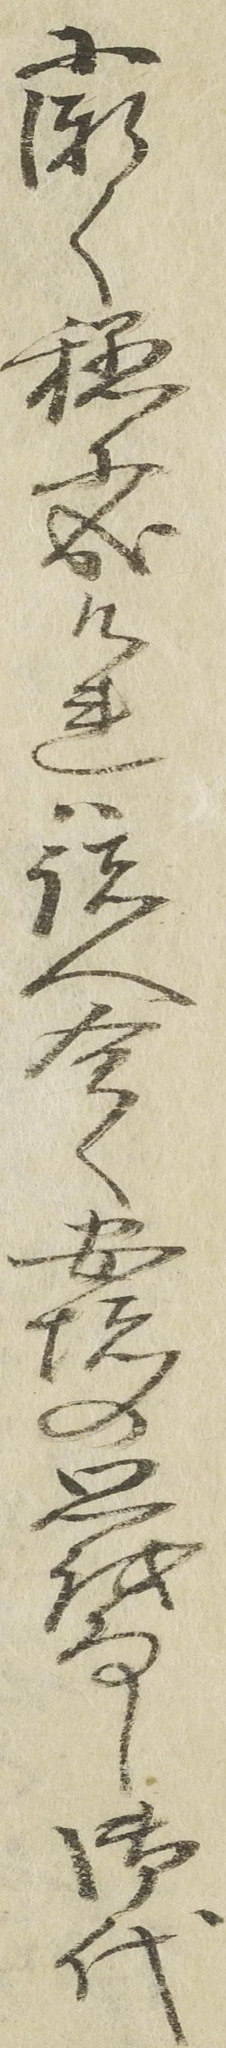に漸く穏に成ケれハ諸人全く安堵の思をなし御代
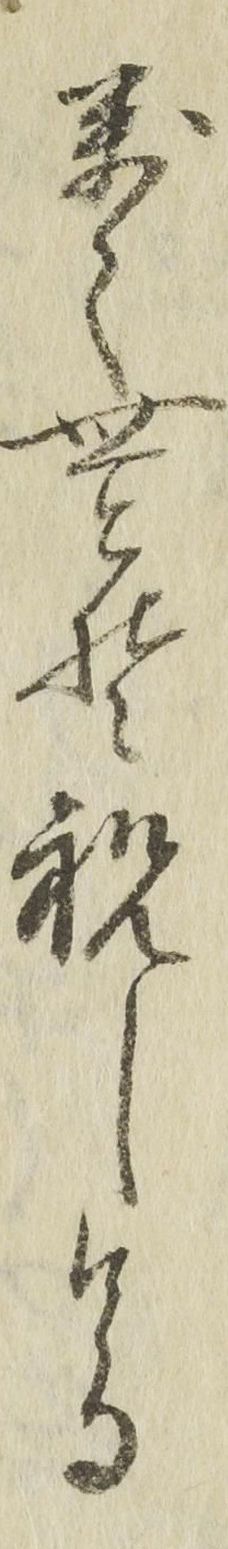万〻世とそ祝しケる
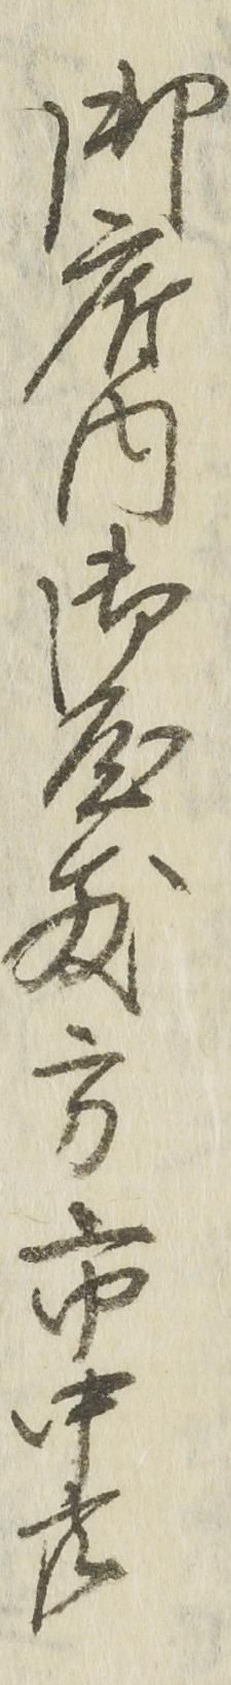御府内御屋敷方市中共
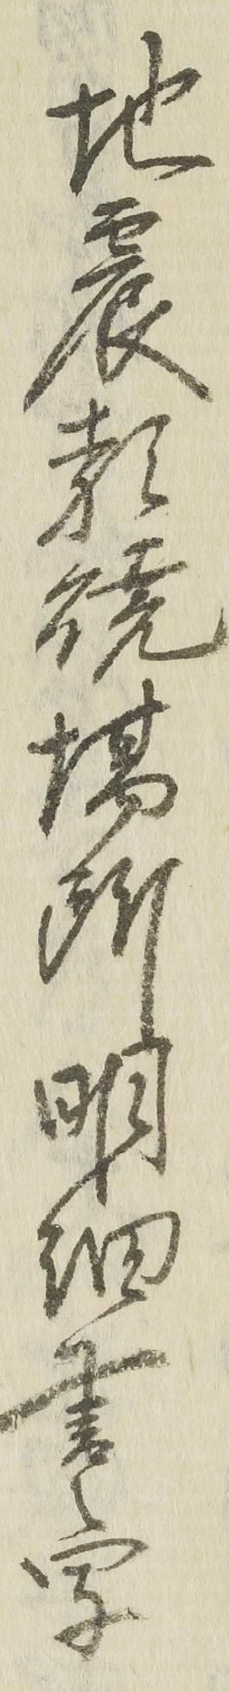地震類焼場所明細書之写
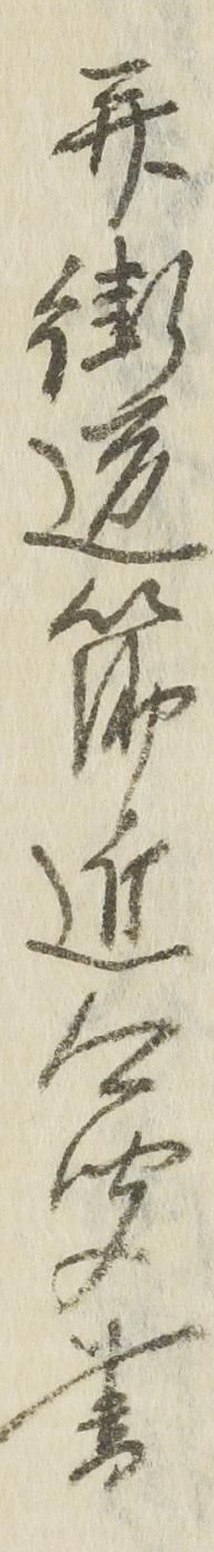幷街道筋近郷聞書
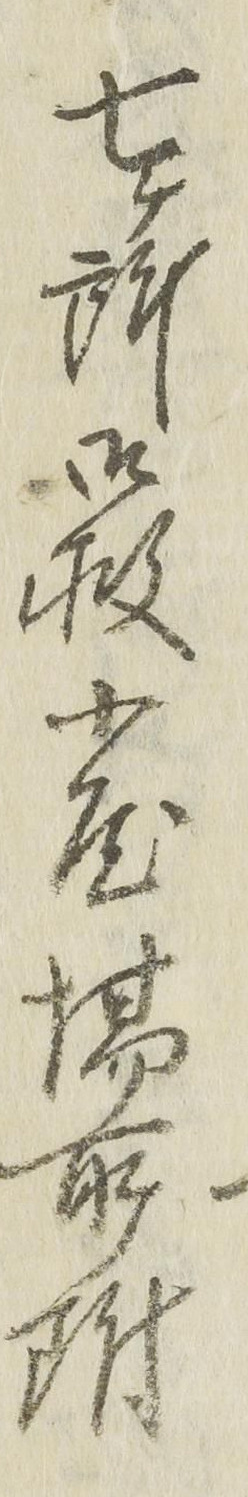七ケ所御救小屋場所附

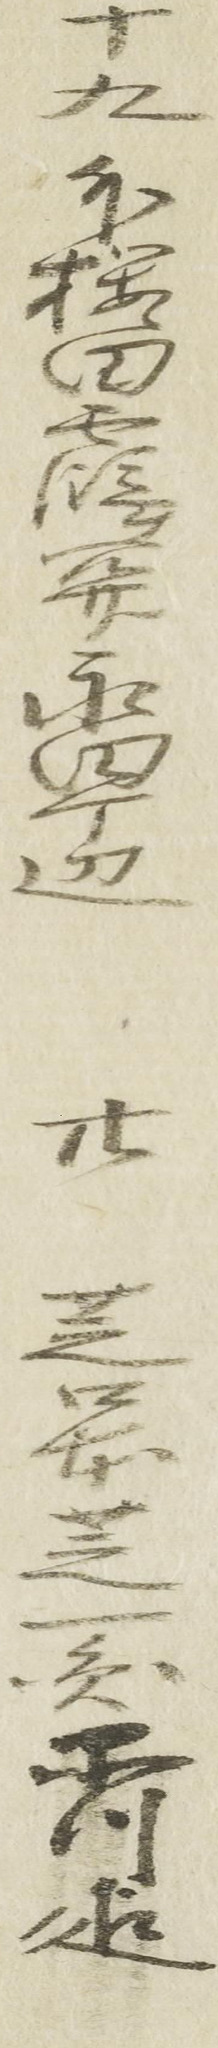十九外桜田霞ケ関永田丁辺廿芝口本芝一圓品川迄
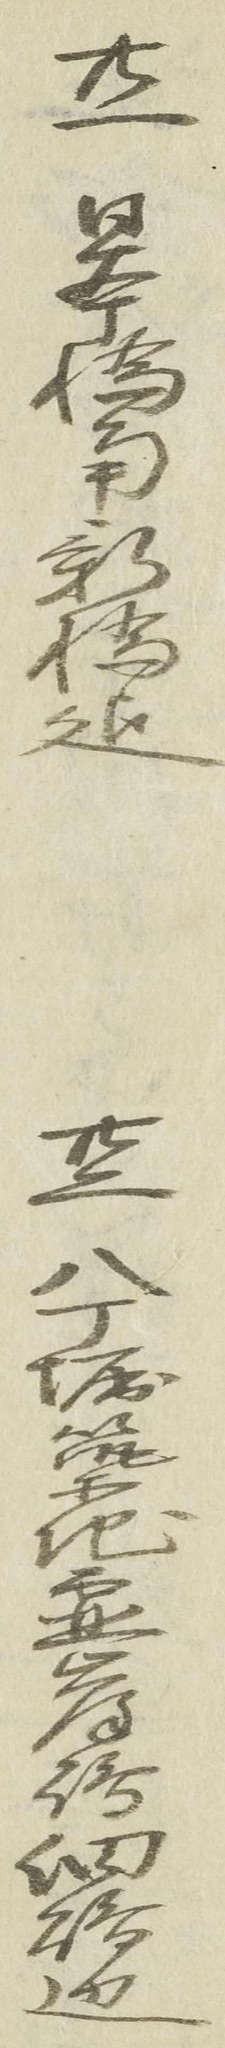廿一日本橋角新橋迄廿二八丁堀築地霊岸嶋佃嶋辺
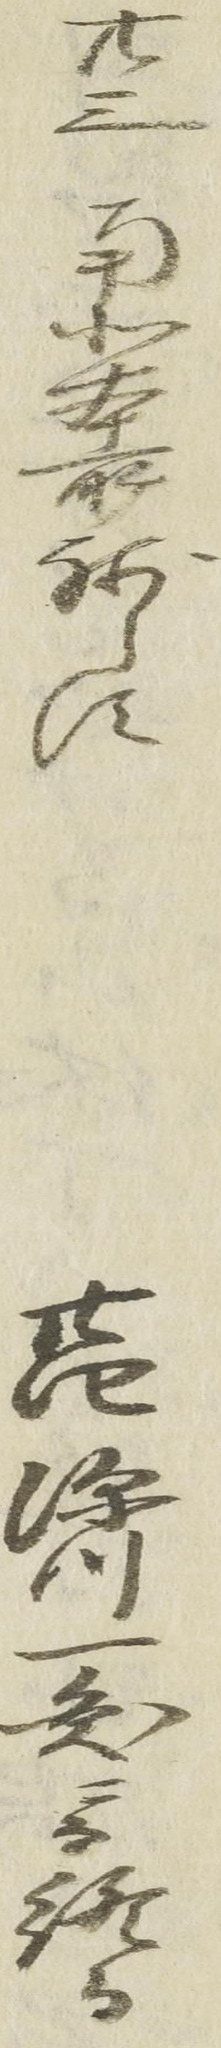廿三南北本所残らす廿四深川一圓ニ而終る
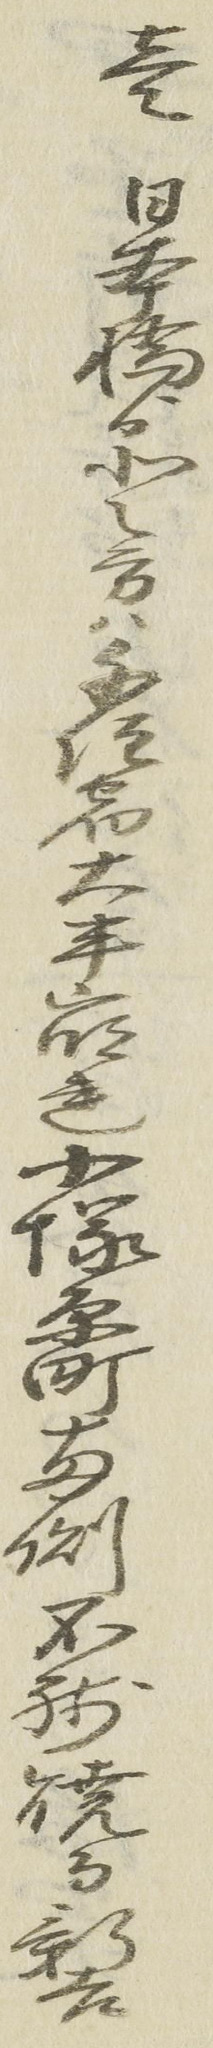壱日本橋ゟ北之方ハ千住宿大半崩れ小塚原町両側不残焼る新吉
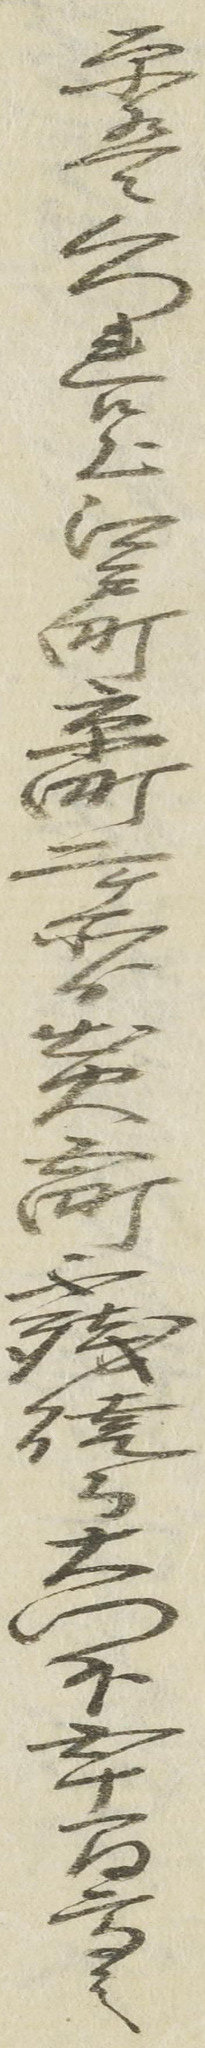原はくつれ候上江戸町京町二ケ所ゟ出火五町不残焼る大門外五十間高之
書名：安政乙卯江戸大地震筆記　安政丙辰八月大阪大雷雨之記追加　安政三辰年七月松前辺大地震并八月大風雨記録
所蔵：東京大学地震研究所図書室 Earthquake Research Institute Library, The University of Tokyo, JAPAN
